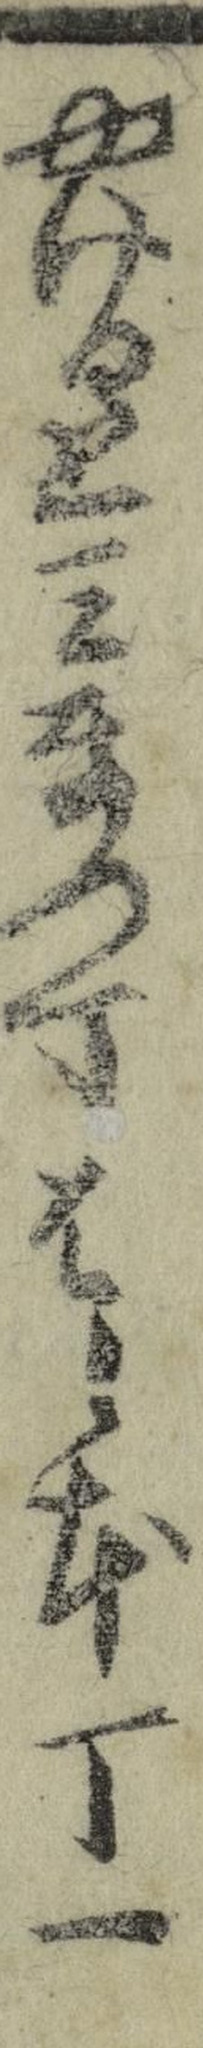やけるとミまつ丁はし本丁一
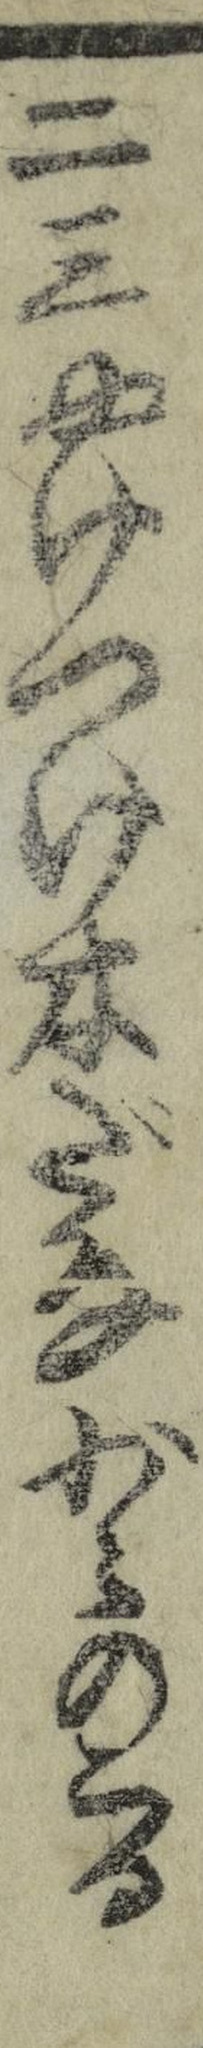二三やけつけ本ださま少々のこる
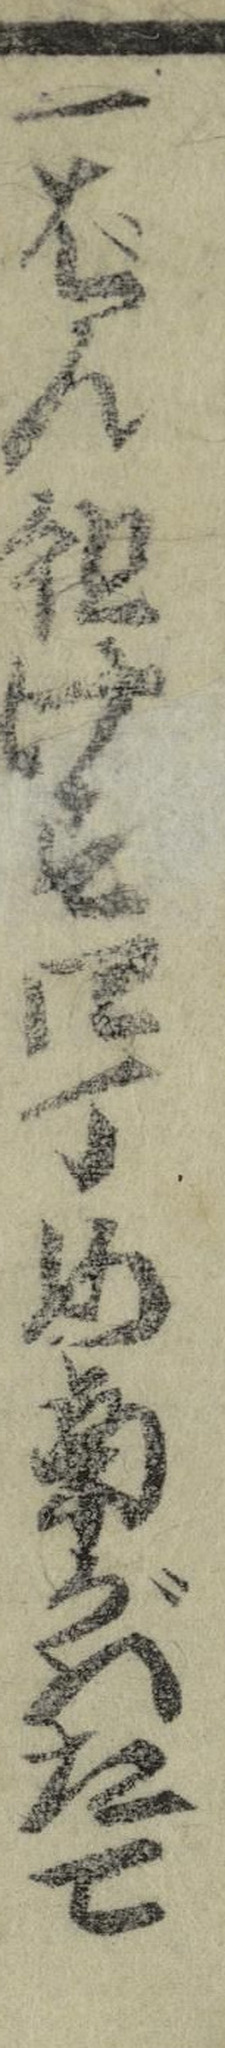一ばん組けす四丁め南がハたて
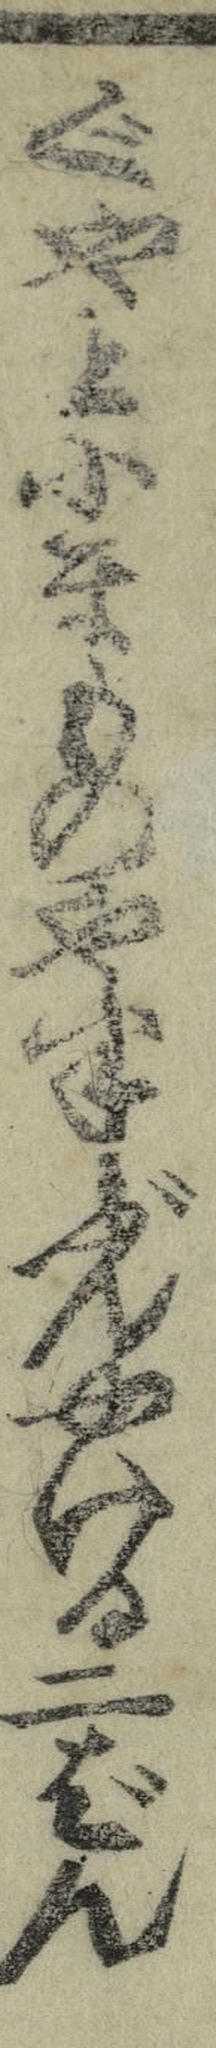ぐやと小まものや半ぶんやける二ばん
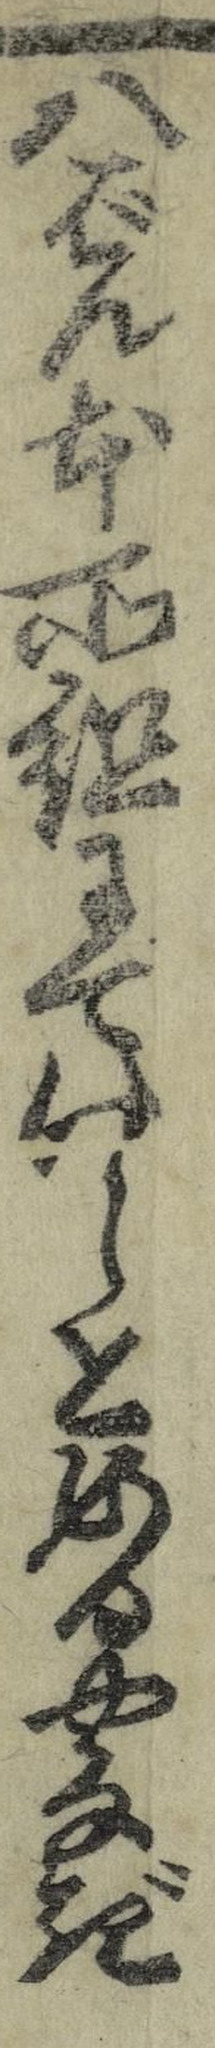八ばん本所組にてけしとめるやなぎ
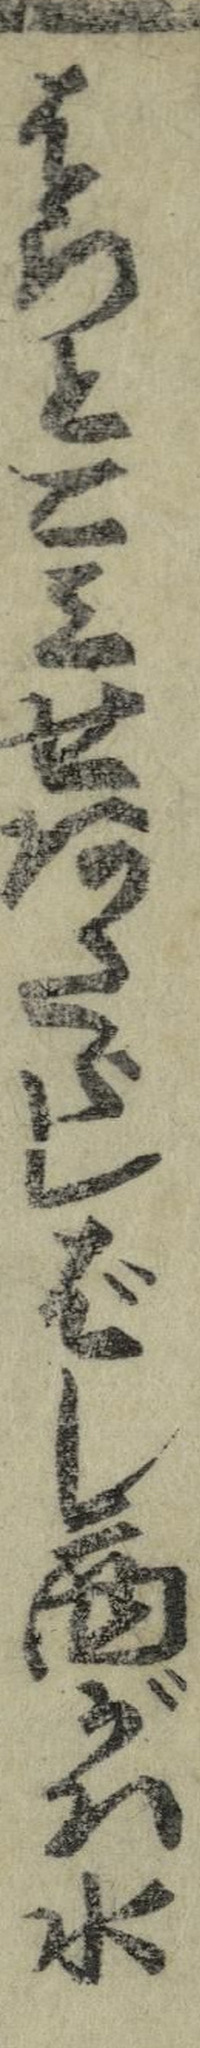はらとこミせあたらしばし西がハ水
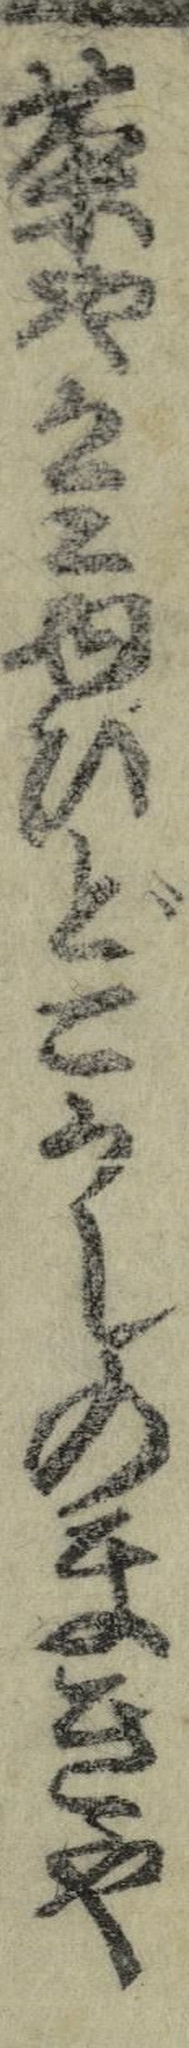茶やかミゆひどこかしのまきや
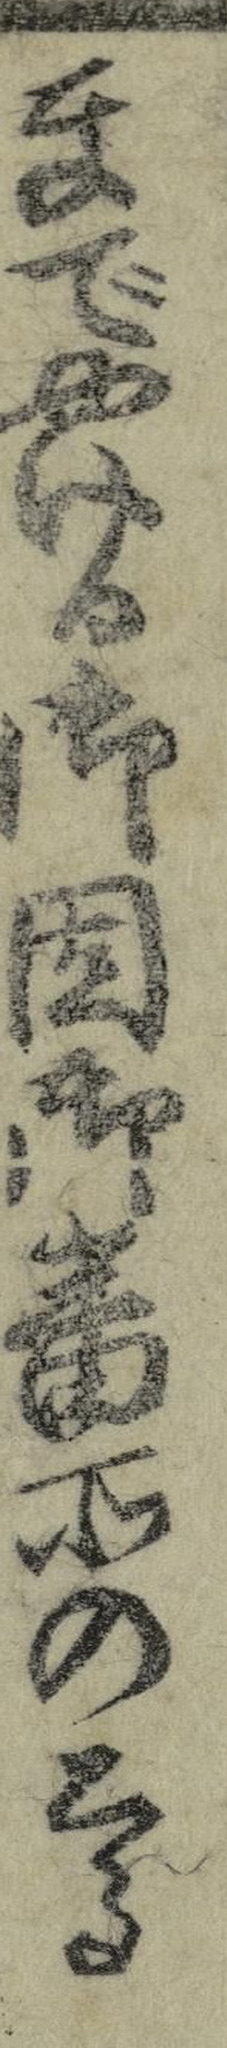までやける御固御番所のこる
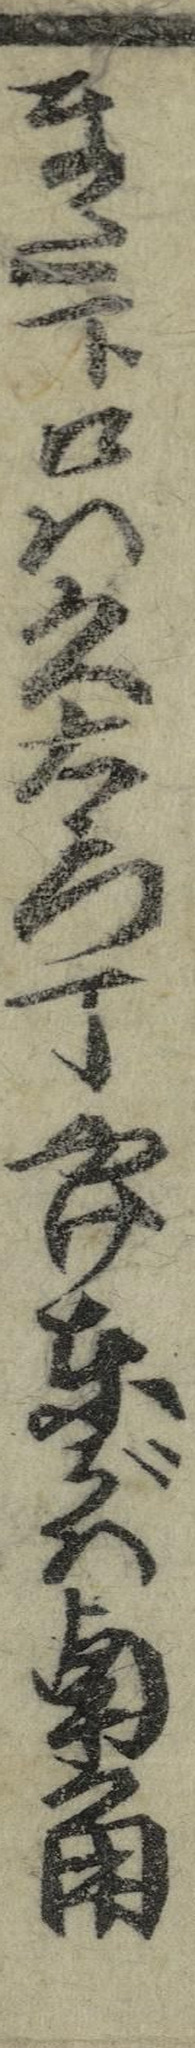また一ﾄ口ハ久右衛門丁やけ東がハ南角
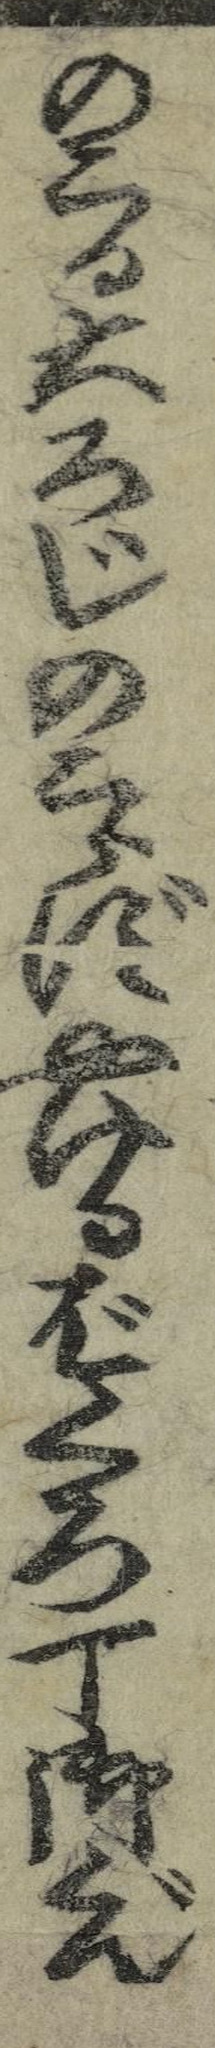のこる大ろじのこらずやけるばくろ丁御ぐん
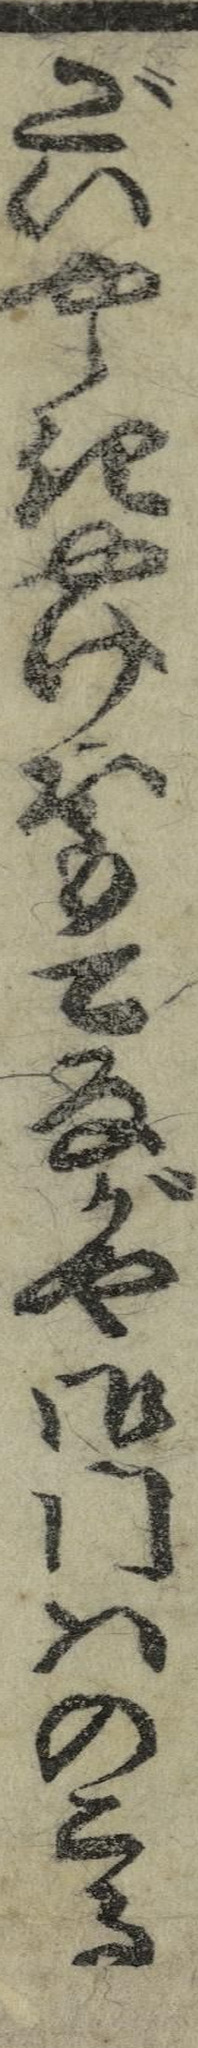だいやしきやけおもてながや御門ハのこる
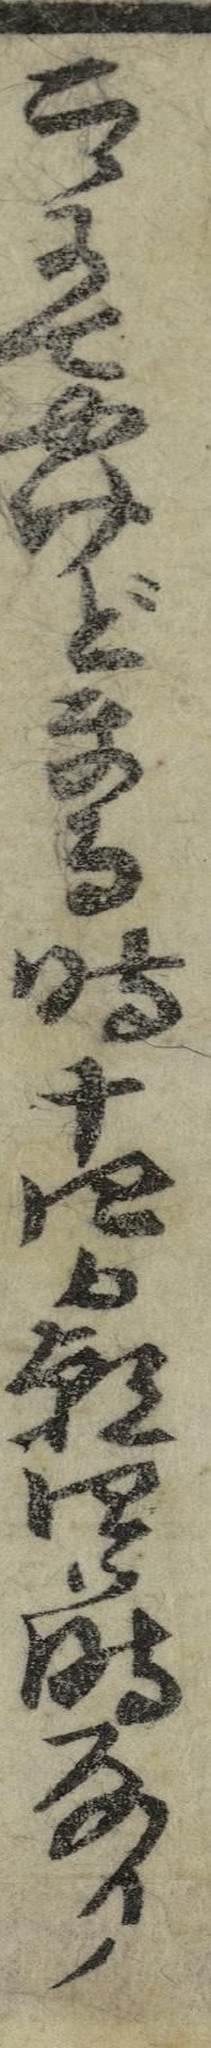こゝにてやけどまる時十四日朝四ッ時なり
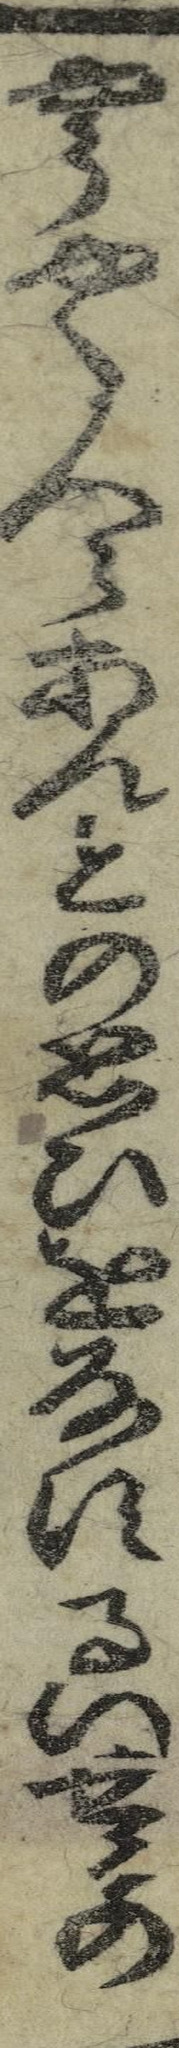やうやく人々あんとの思ひをなするいせうの
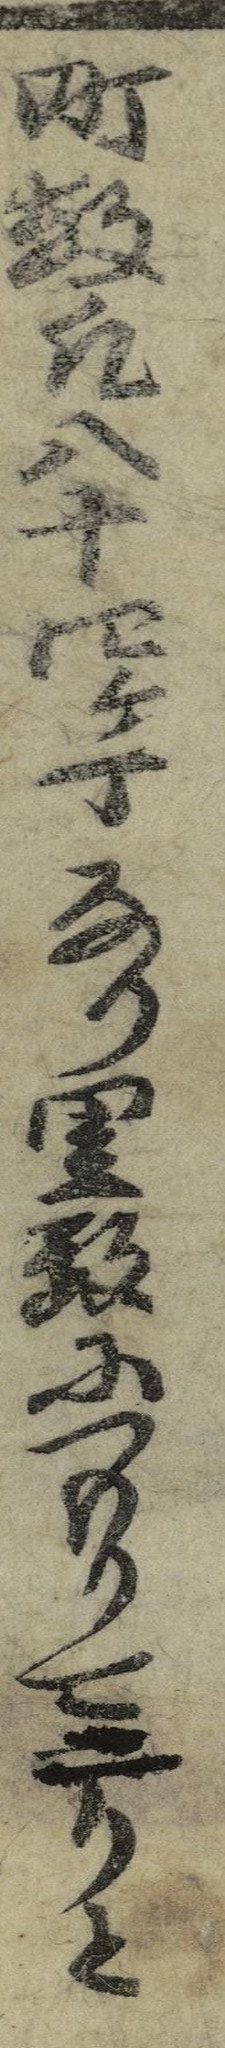町数凡八十四ヶ丁なり里数につもりて二りと
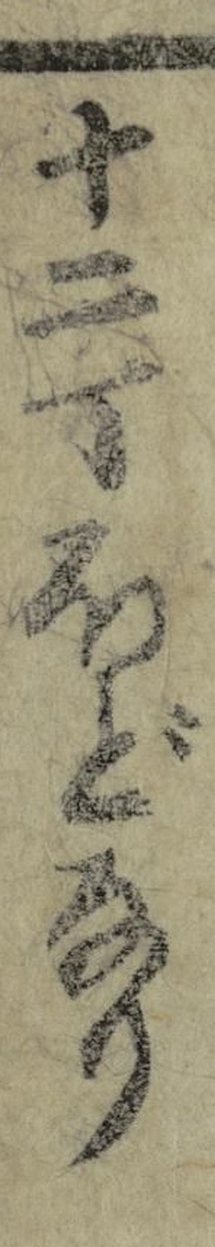十二丁ほどなり
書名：焼場方角附
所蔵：東京大学地震研究所図書室 Earthquake Research Institute Library, The University of Tokyo, JAPAN
